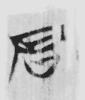君
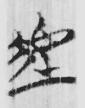𫊟
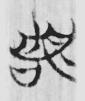若
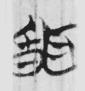䎽
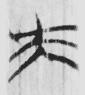夫
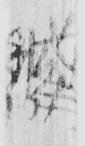{邑戊隹}
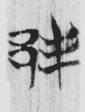邦
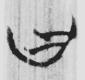曰
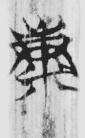康
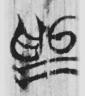爲
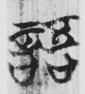語
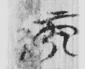而
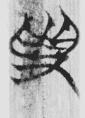受
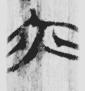亦
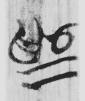爲
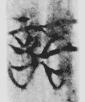語
